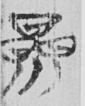參（三）
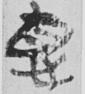惪
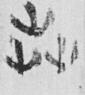卉
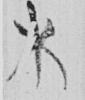木
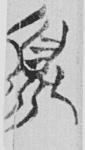須
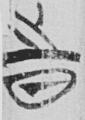○（時）
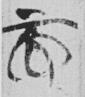而
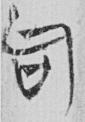句（後）
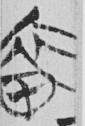○（奮）
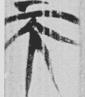天
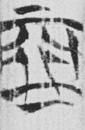亞（惡）
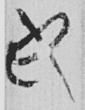女（如）
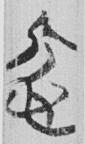忻
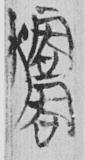○（平）
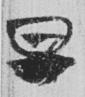旦
